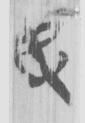奴
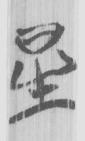星
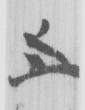之
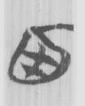西
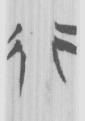行
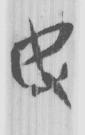奴
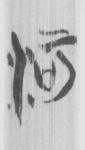河
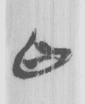白
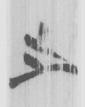之
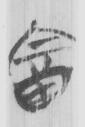富
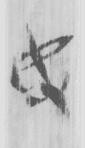奴
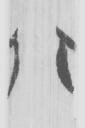北
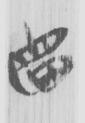{母田}
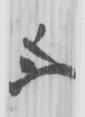之
